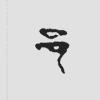邑
